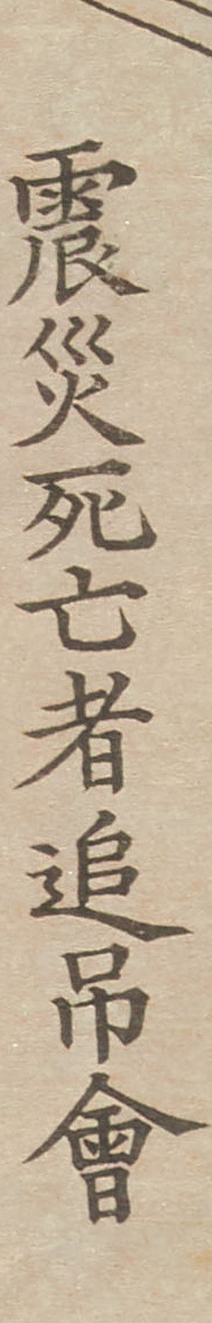震災死亡者追弔会
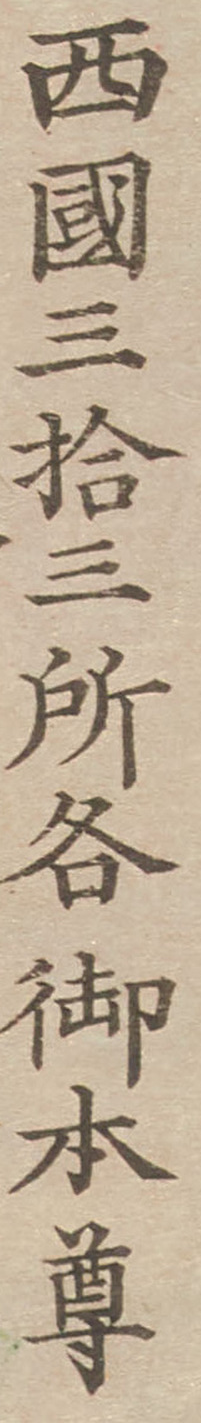西国三拾三所各御本尊
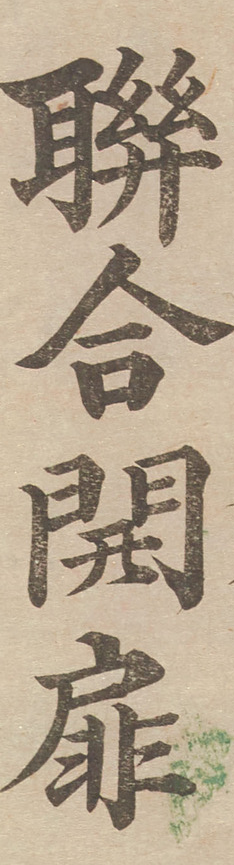聯合開扉
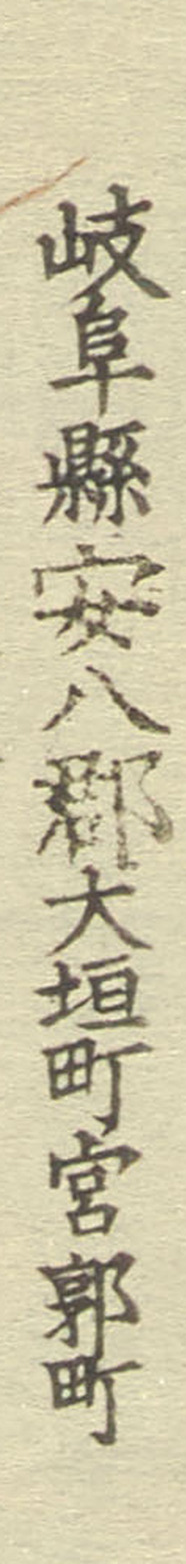岐阜県安八郡大垣町宮郭町
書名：美濃国大垣市街精図
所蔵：東京大学総合図書館 General Library in the University of Tokyo, JAPAN
